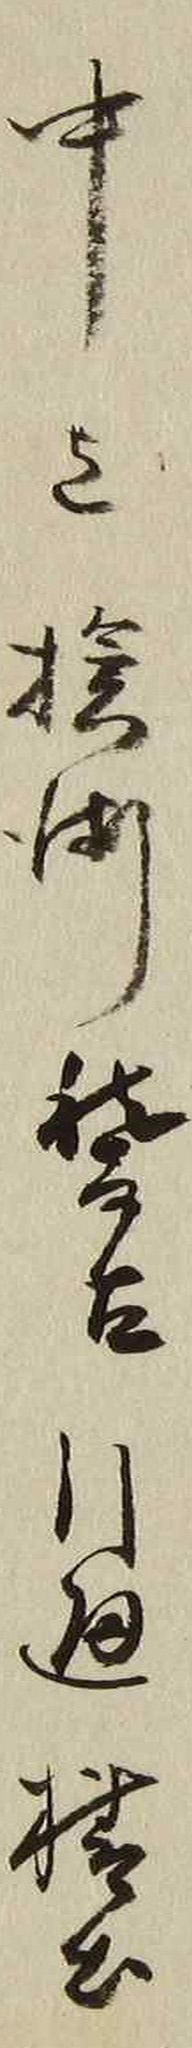中迄槍術稽古引通精出
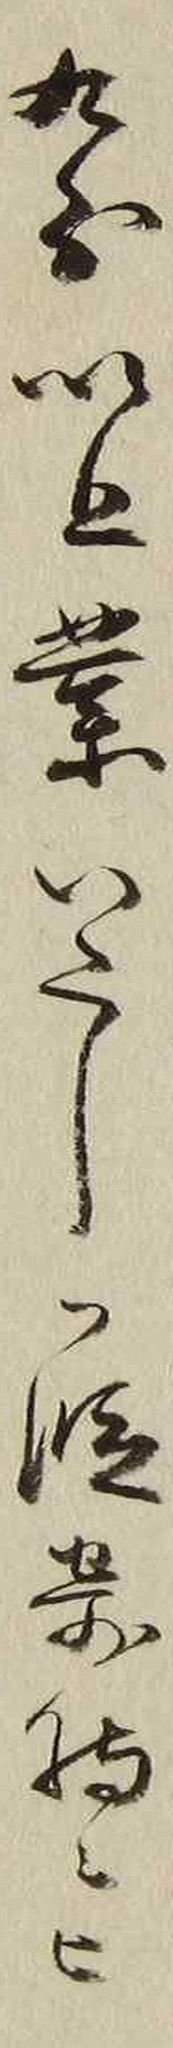九分以上業いたし候段奇特ニ被
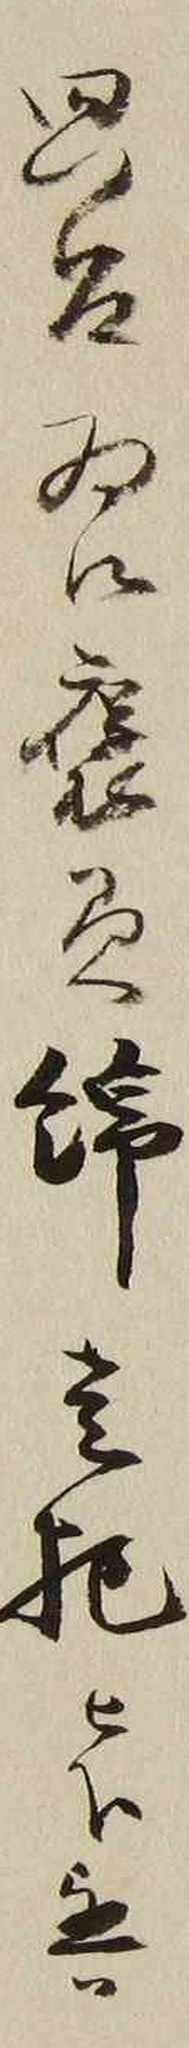思召為御褒美綿壱把被下置候
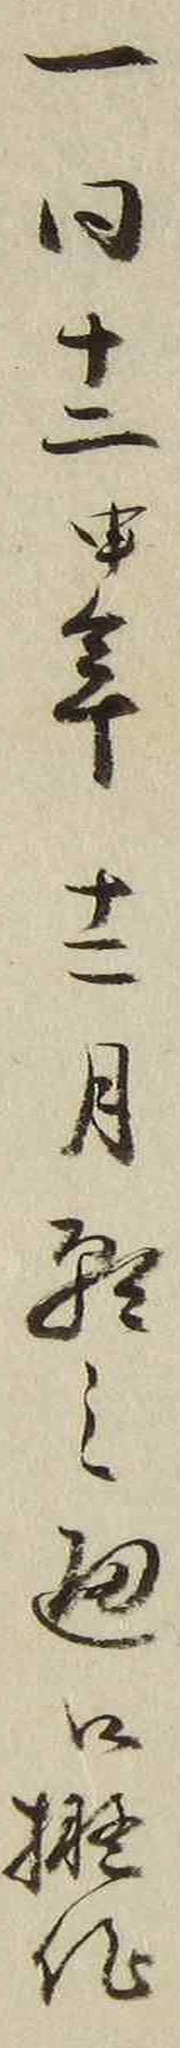一同十二申年十二月願之通御擬作
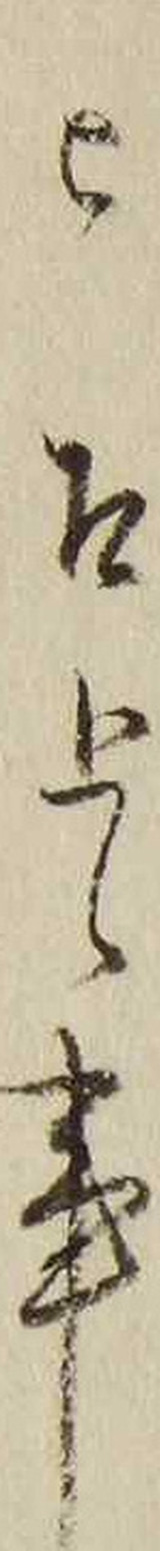被召上候事

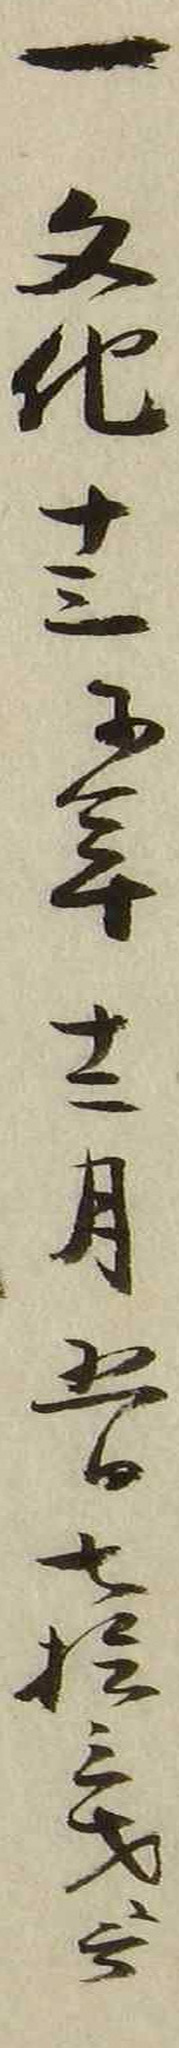一文化十三子年十二月五日七拾三才ニ而
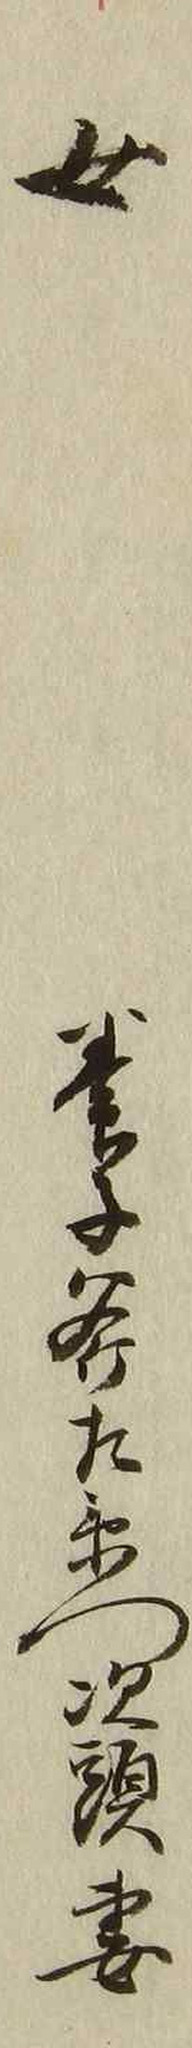女養子斧左衛門次頭妻
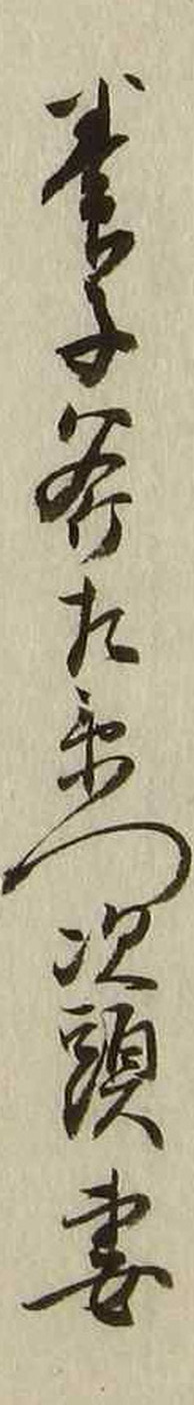女養子斧左衛門次頭妻
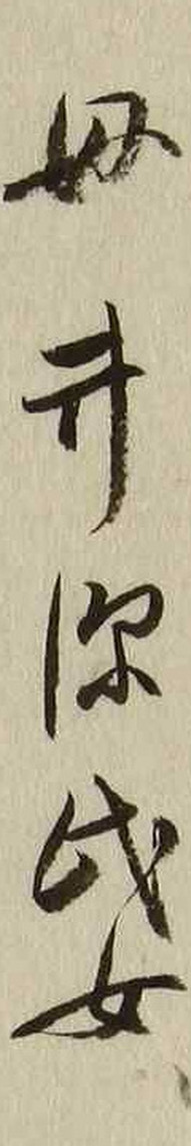母井深氏女
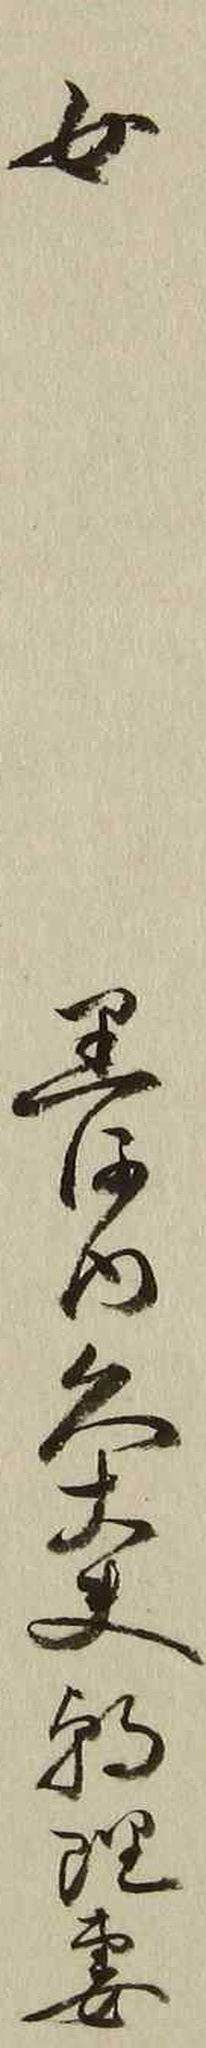女黒河内久大夫朝理妻
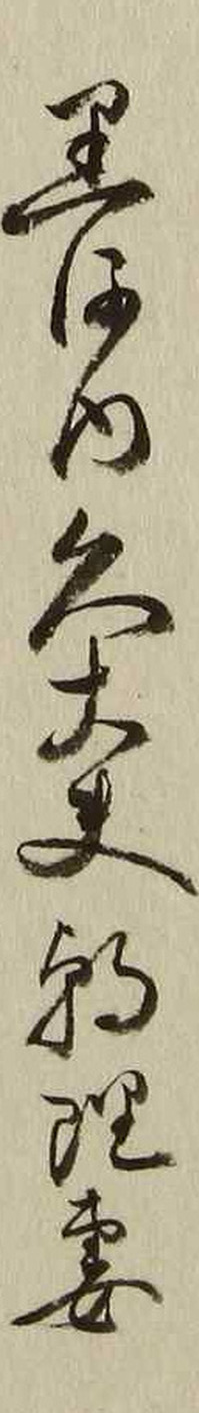女黒河内久大夫朝理妻
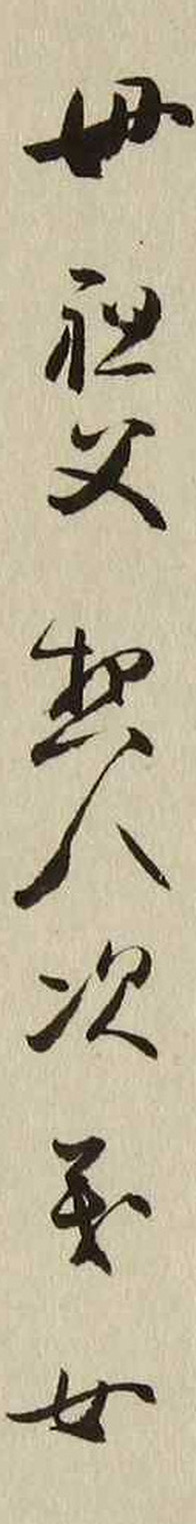母祖父惣八次茂女
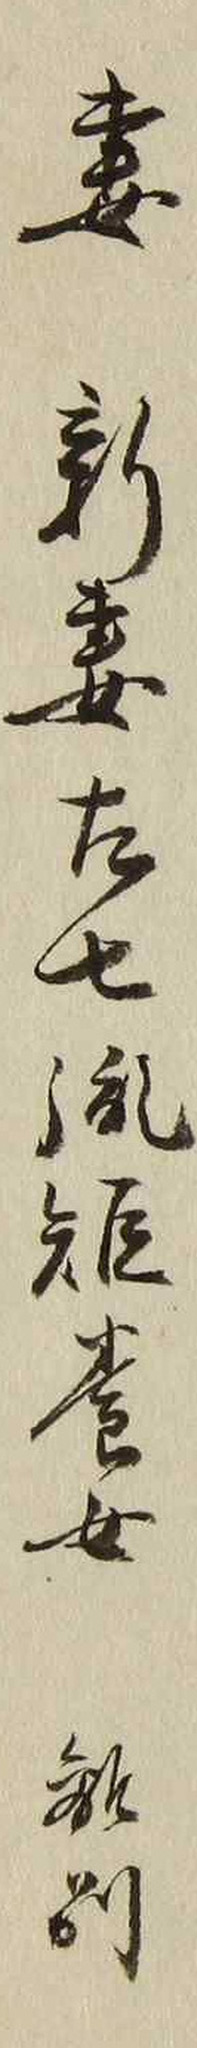妻新妻左七胤矩養女離別
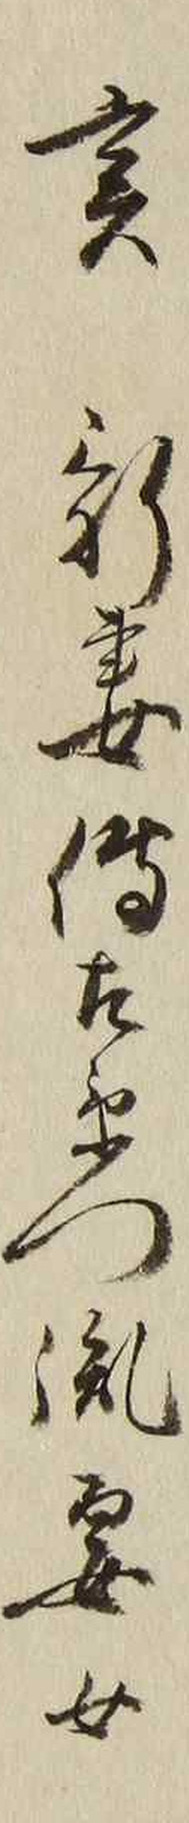実新妻伝左衛門胤要女

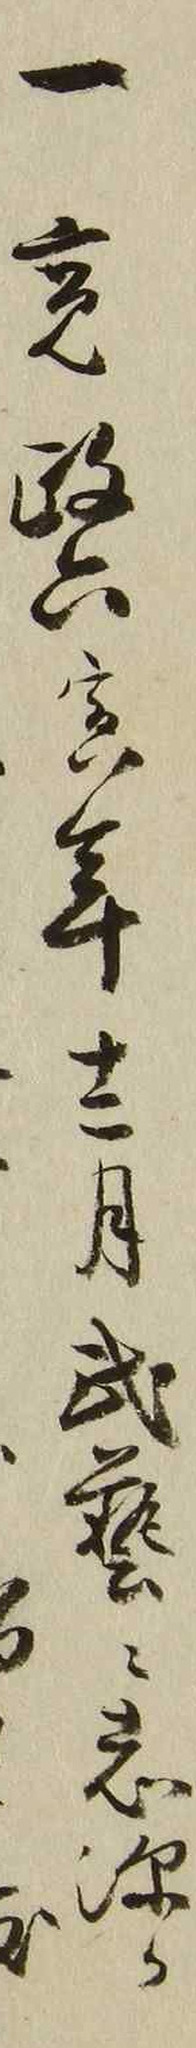一寛政六寅年十二月武芸ニ志深ク
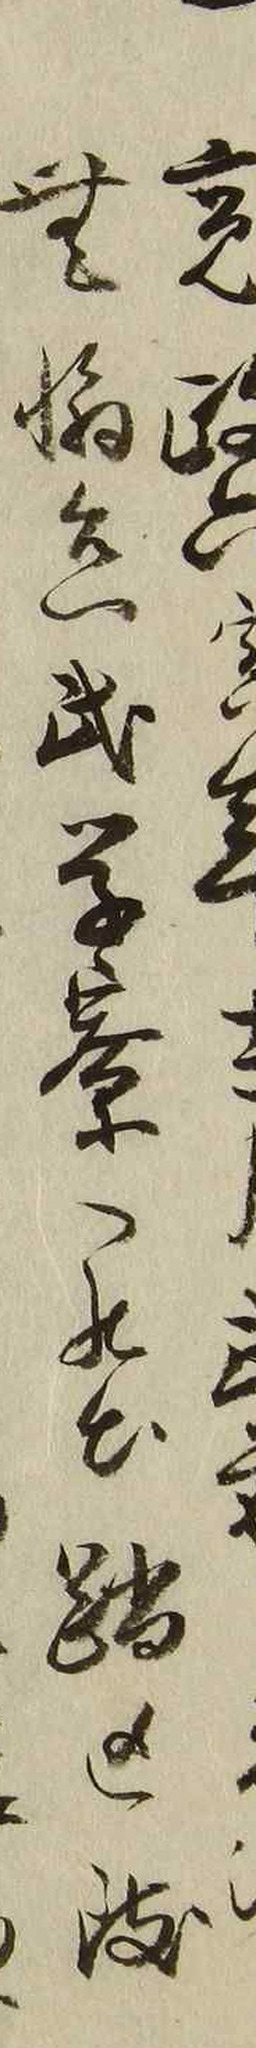無懈怠武学寮罷出踏込致
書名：諸士系譜　巻之288　さ之部20
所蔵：会津若松市立会津図書館
